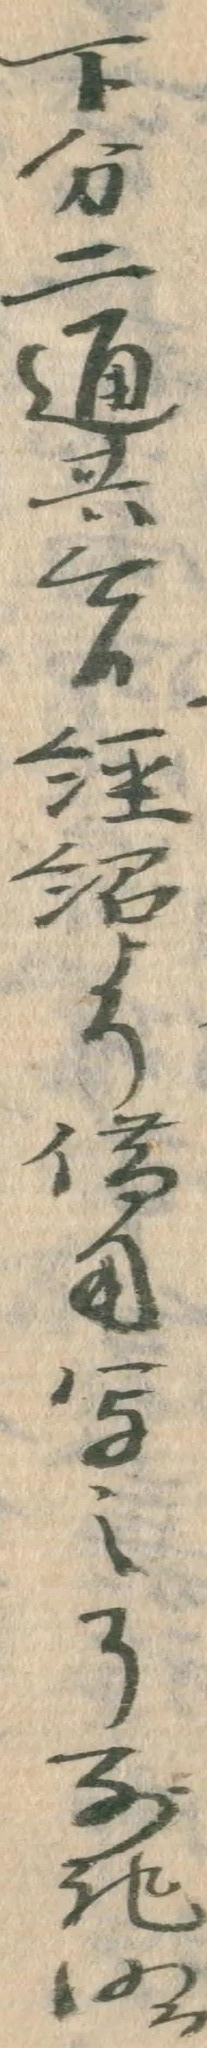下分二通共、今日経紹より借用写之了、前記仍而
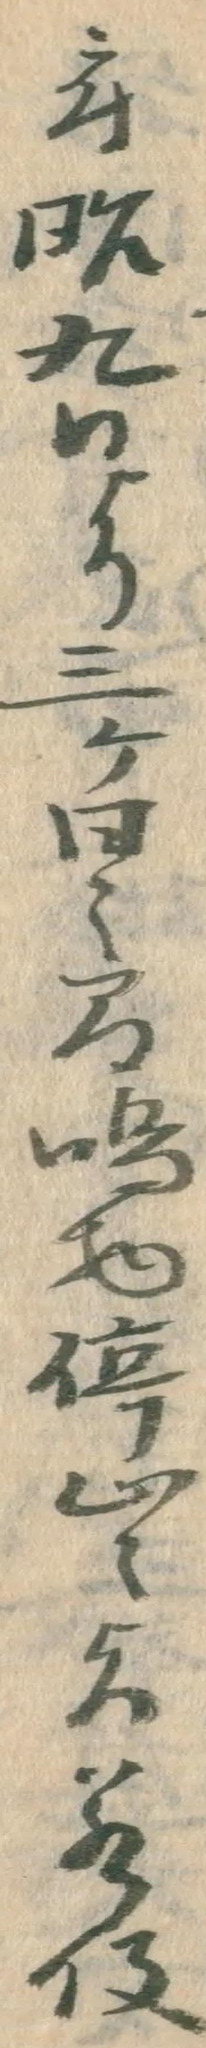ニ付、昨九日より三ヶ日之間鳴物停止之旨、若役
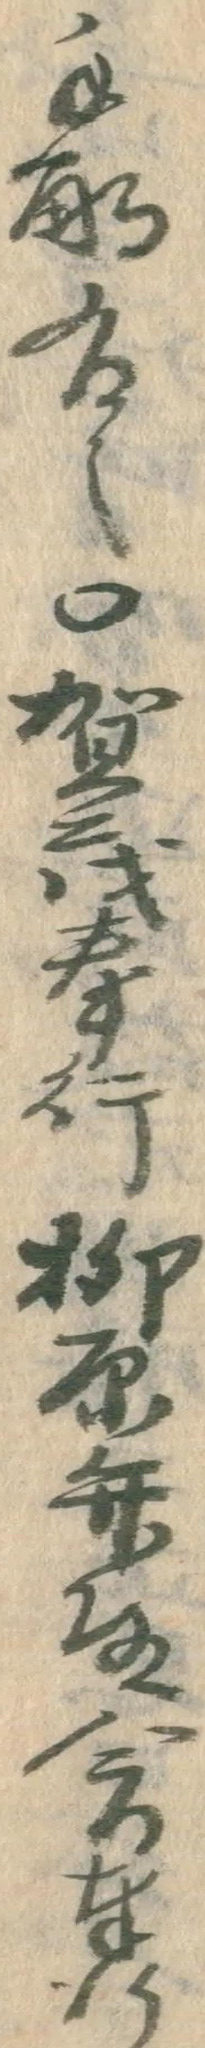手配有之、○賀茂奉行柳原弁殿、今日奉行
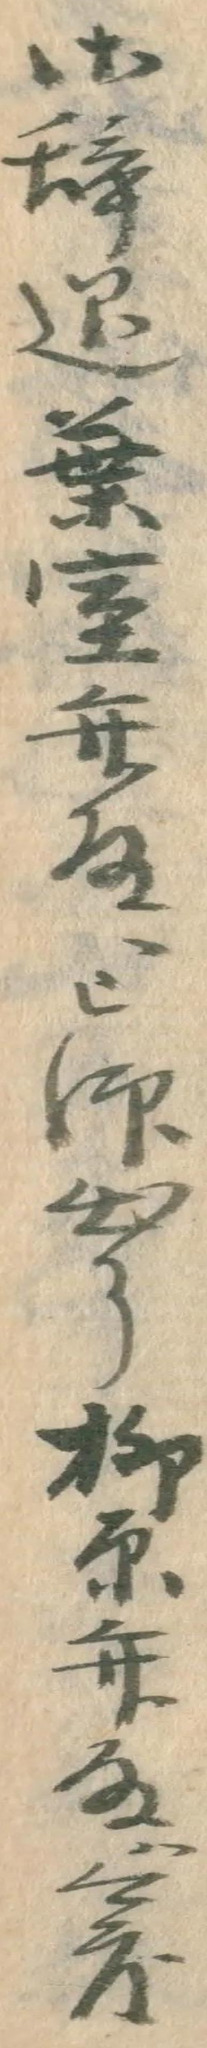御辞退、葉室弁殿へ被仰出了、柳原弁殿ハ今度

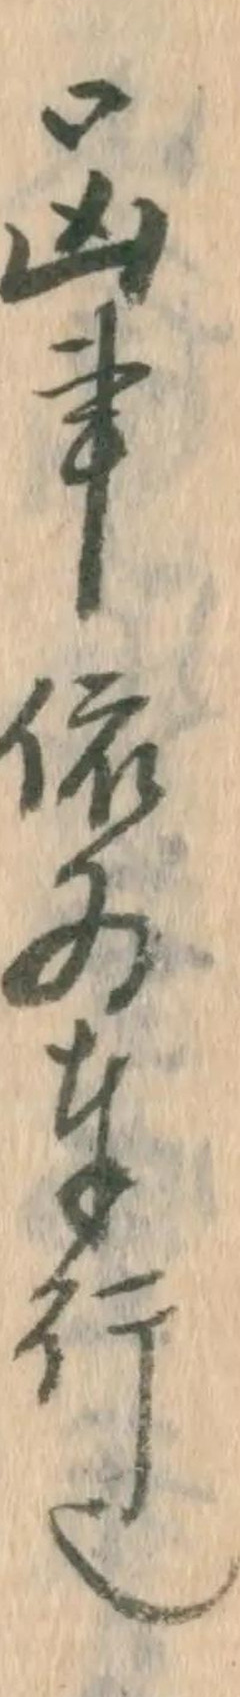御凶事依為奉行也、
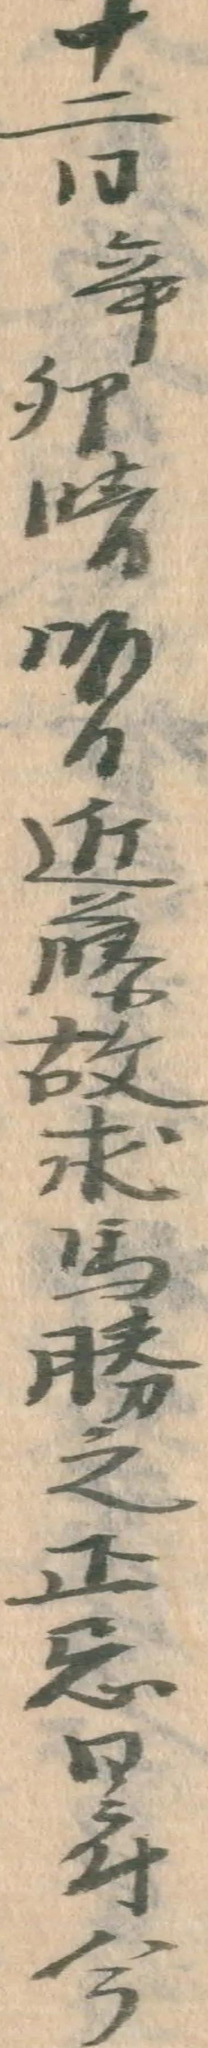十二日辛卯晴、昨日近藤故求馬勝之正忌日ニ付、今
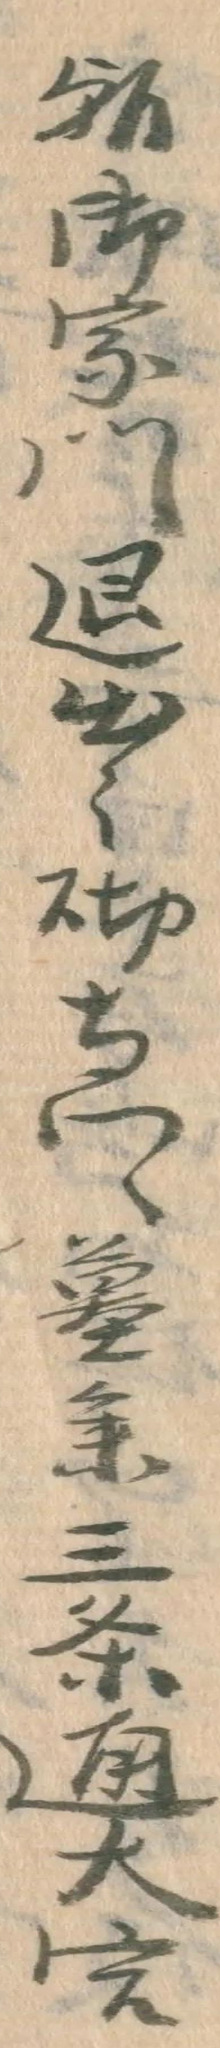朝御宗門退出之砌寺門へ墓参、三条通大宮
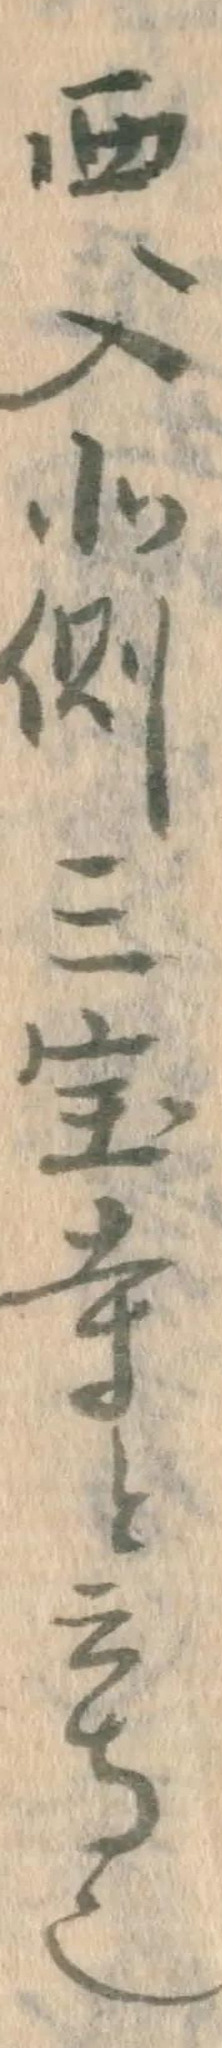西へ入北側、三宝寺と云寺也、
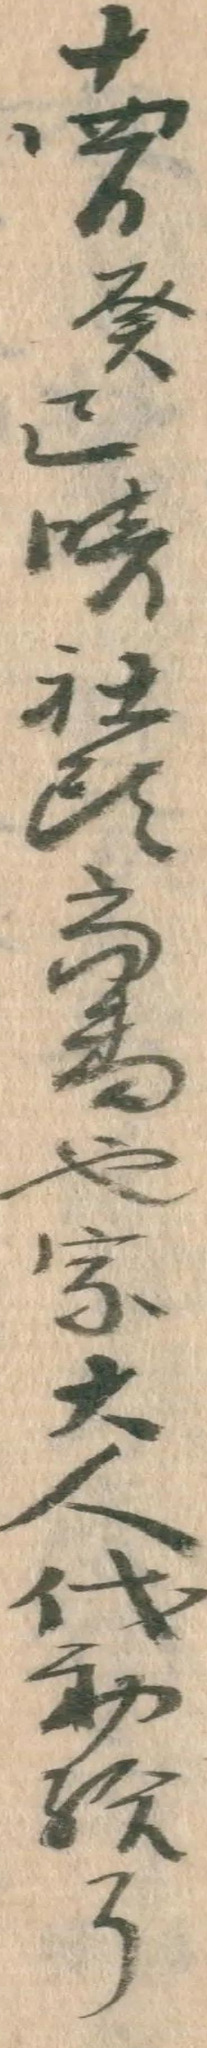十四日癸巳晴、社頭当番也、家大人代勤様了、
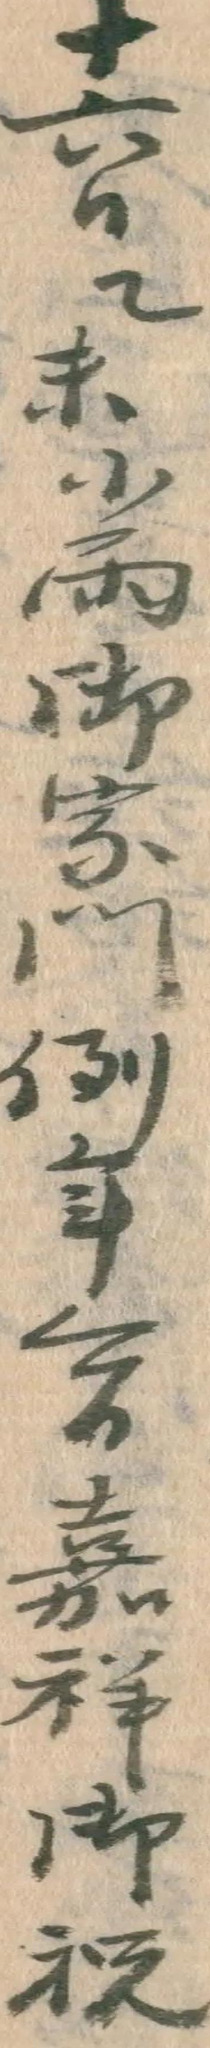十六日乙未小雨、御家門例年今日嘉祥御祝
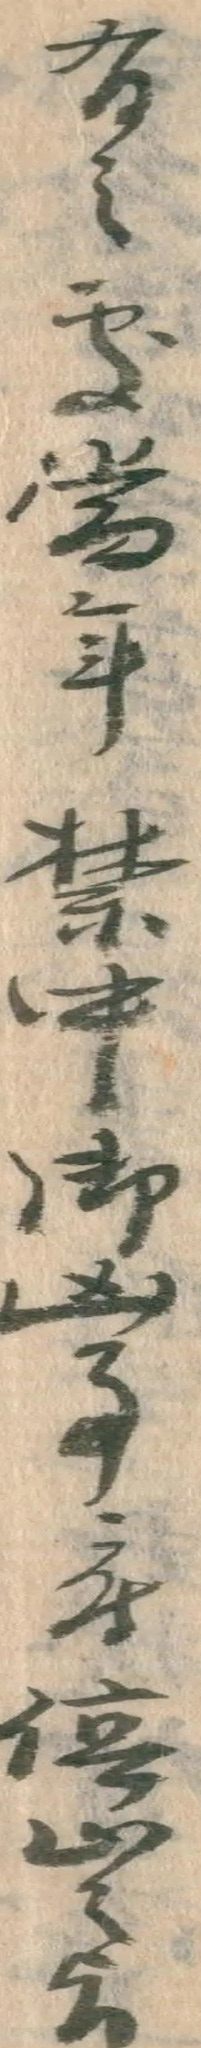有之處、當年禁中御凶事ニ付停止之旨
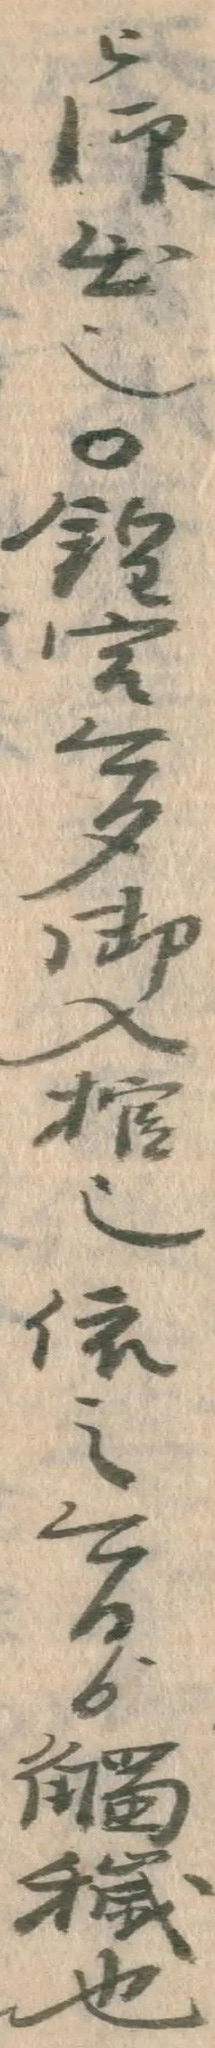被仰出也、○鍠宮今夕御入棺也、依之今日ゟ觸穢也、
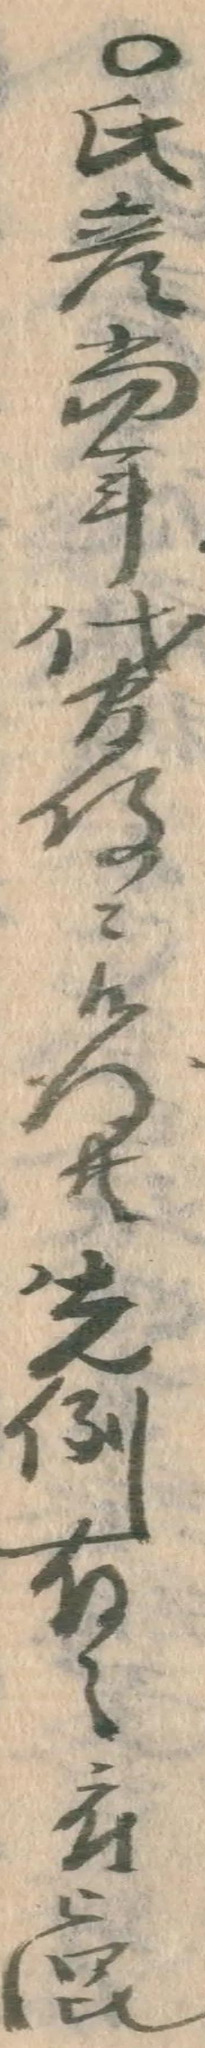〇氏彦當年代官役に候得共、先例有之ニ付被混
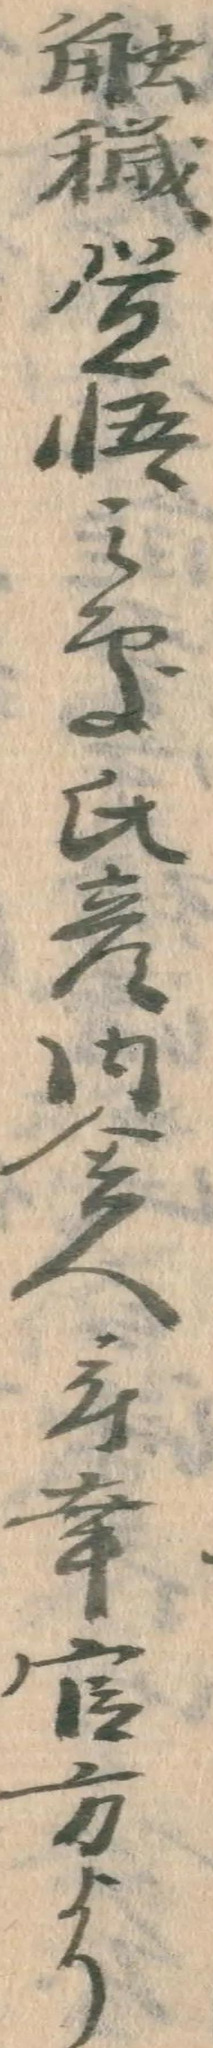触穢覚悟之處、氏彦内舎人ニ付、幸官方より
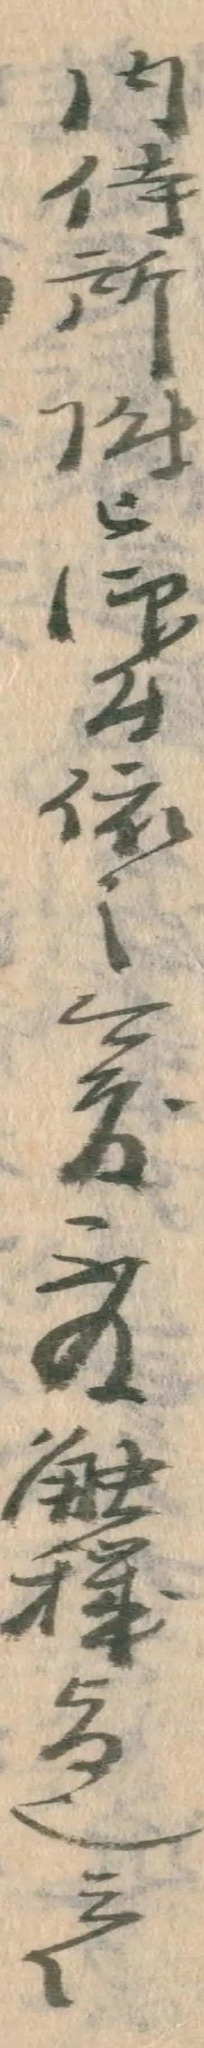内侍所附被仰付依之、今度不及触穢旨也云々、
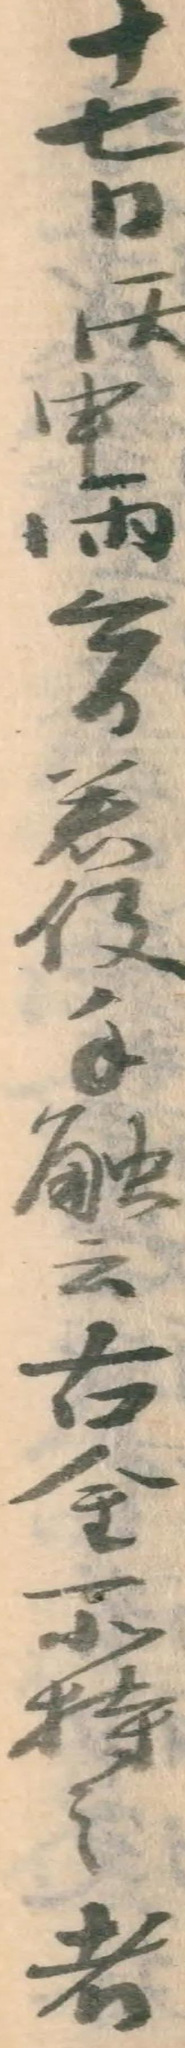十七日丙申雨、今日若役手触云、古金所持之者
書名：賀茂社記録. 第63冊
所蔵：国立国会図書館 National Diet Library, JAPAN
